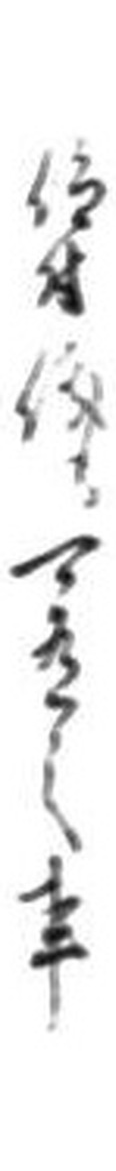仰付儀も可有之事
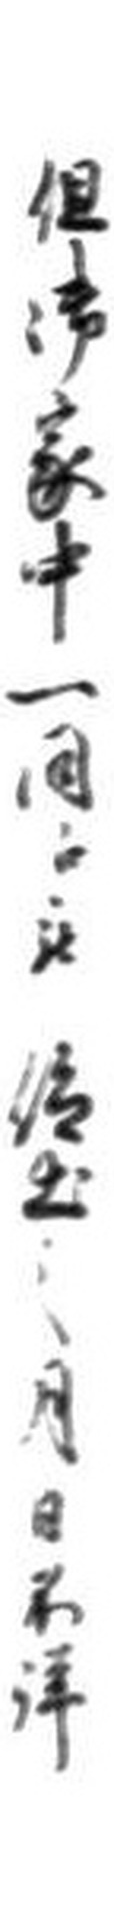但御家中一同江被仰出之月日不詳
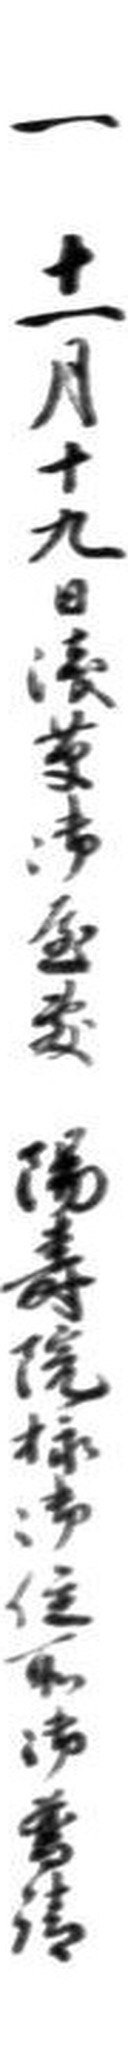一十一月十九日浅草御屋敷陽寿院様御住所御普請
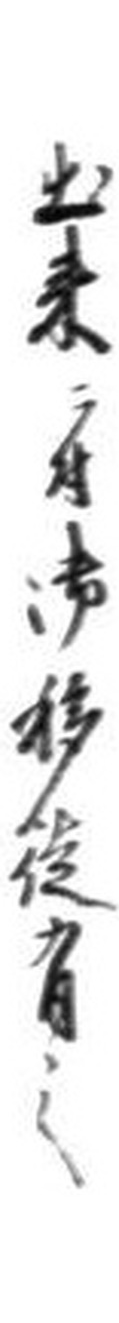出来ニ付御移徒有之

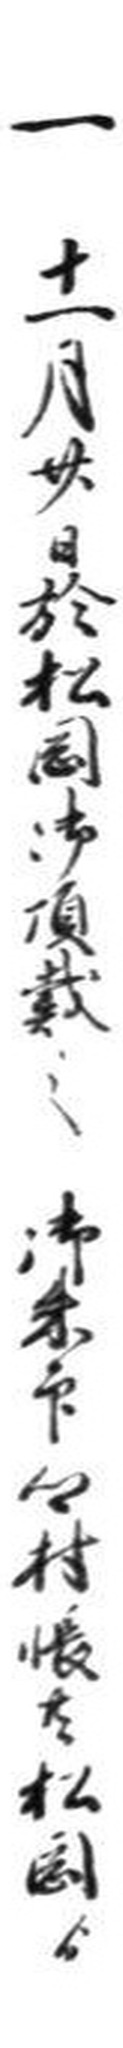一十一月廿日於松岡御頂戴之御朱印郷村帳共松岡ゟ
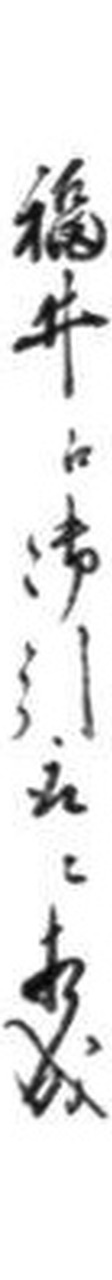福井江御引取ニ相成
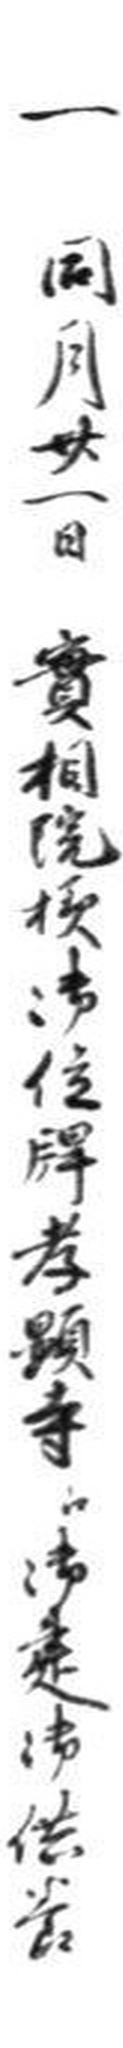一同月廿一日実相院様御位牌孝顕寺江御建御供養
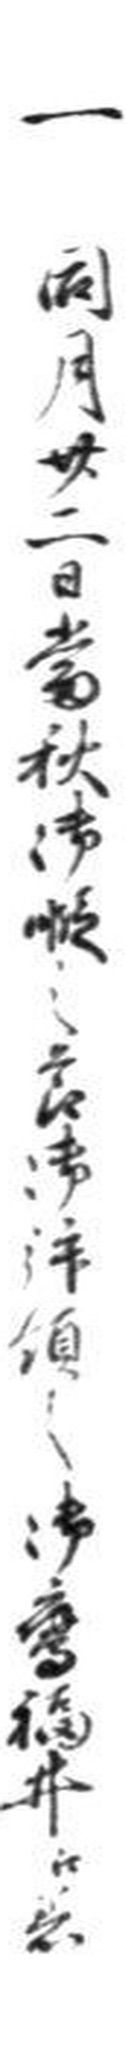一同月廿二日当秋御暇之節御拝領之御鷹福井江着
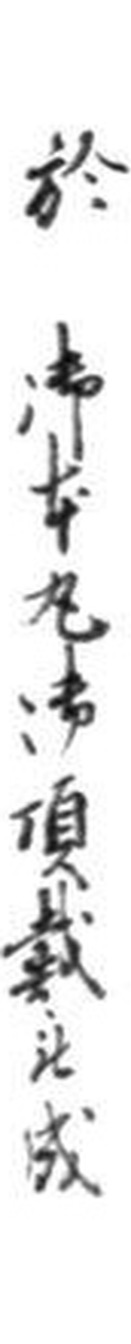於御本丸御頂戴被成
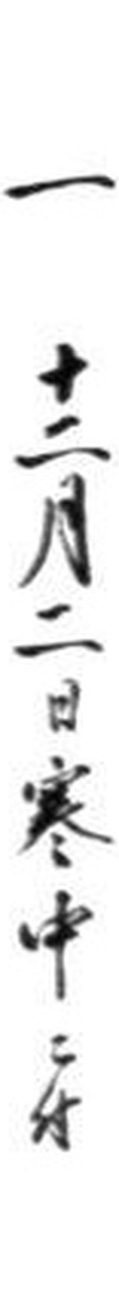一十二月二日寒中ニ付
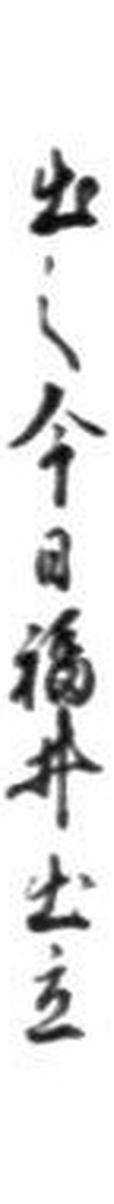出之今日福井出立
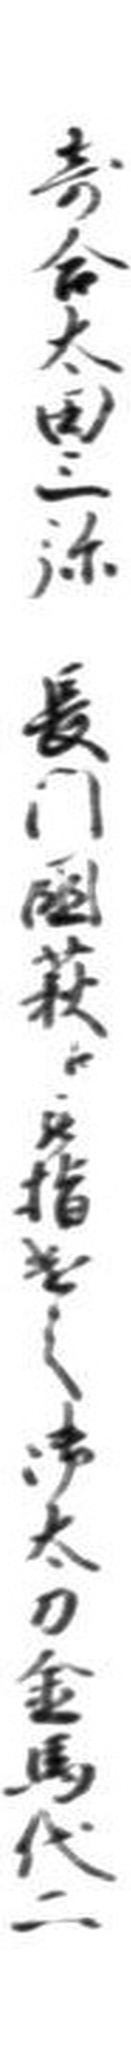寄合太田三弥長門国萩江被指遣之御太刀金馬代二
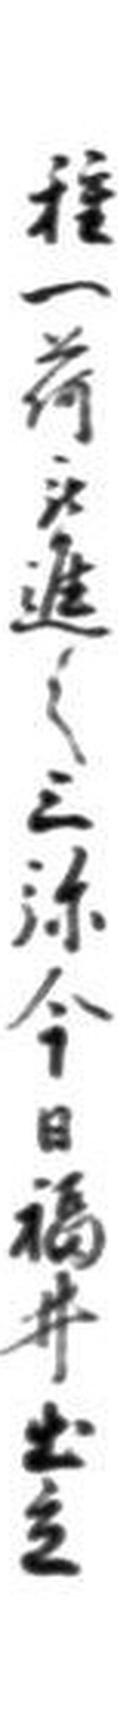種一荷被進之三弥今日福井出立
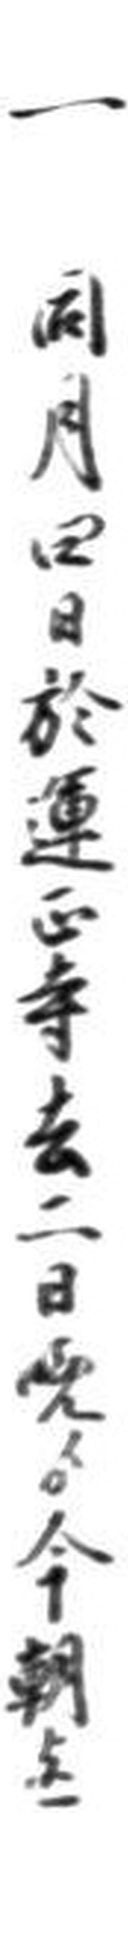一同月四日於運正寺去二日晩ゟ今朝迄
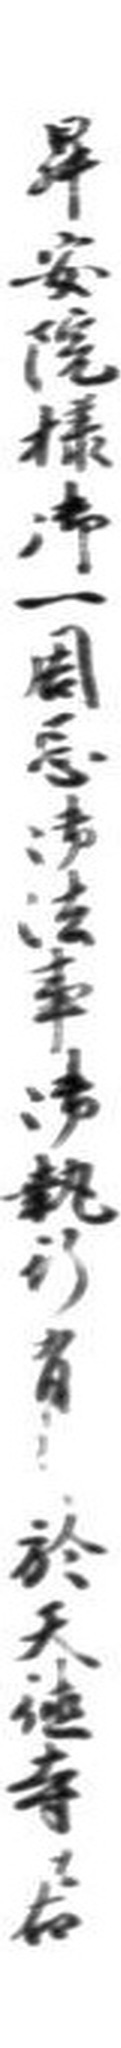昇安院様御一周忌御法事御執行有之於天徳寺も右
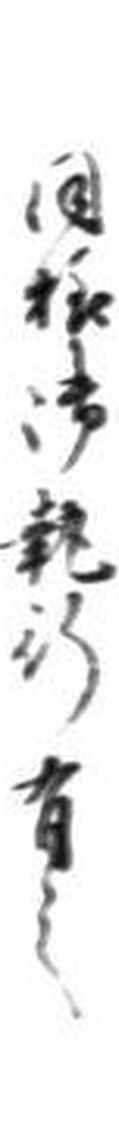同様御執行有之
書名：家譜 三十五 宗昌公 従享保六年到同七年
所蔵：福井県文書館 Fukui Prefectural Archives
